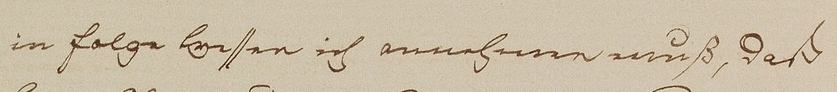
in Folge wessen ich annehmen muß, daß
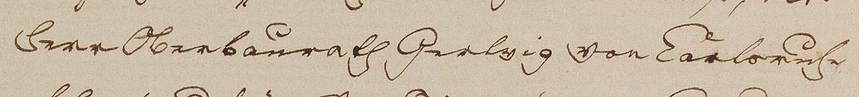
Herr Oberbaurath Gerwig von Carlsruhe
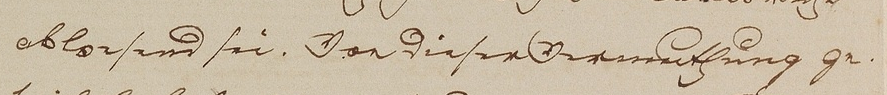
abwesend sei. Von dieser Vermuthung ge-
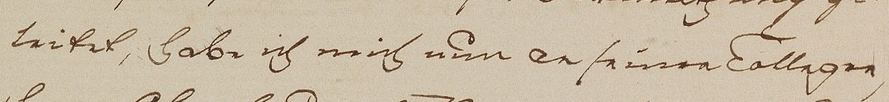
leitet, habe ich mich nun an seinen Collegen
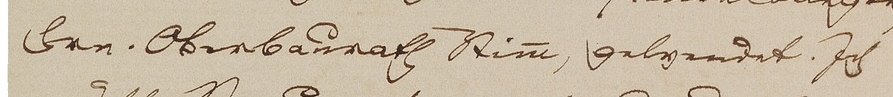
Hrn. Oberbaurath Stimm, gewendet. Ich
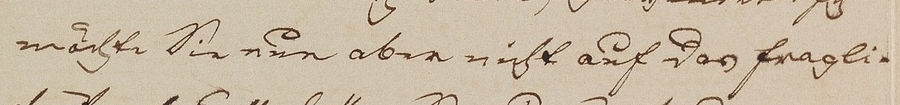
möchte Sie nun aber nicht auf das fragli-
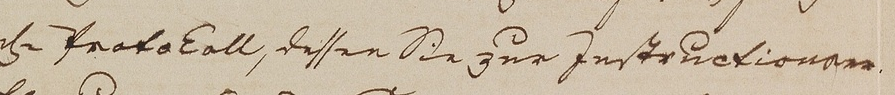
che Protokoll, dessen Sie zur Instructionser-
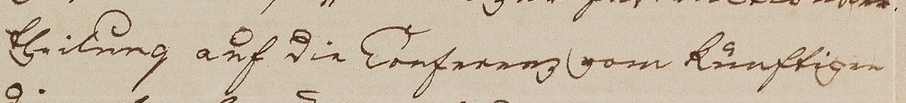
theilung auf die Conferenz vom künftigen
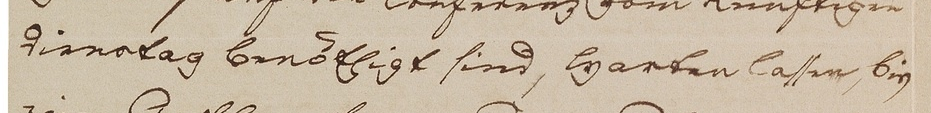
Dienstag benöthigt sind, warten lassen, bis
